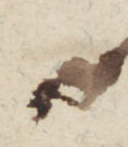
110.
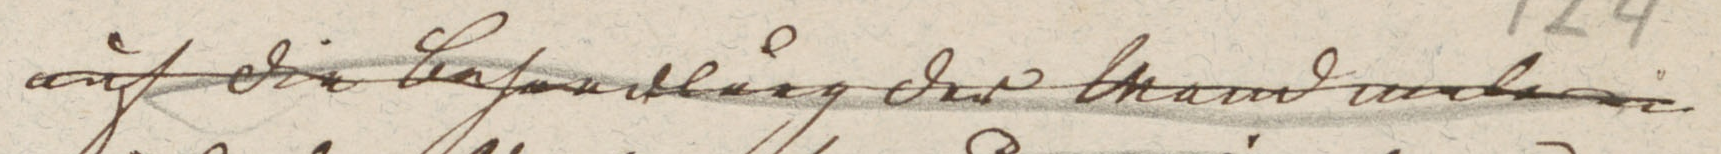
auf die Behandlung der Wandmalerei
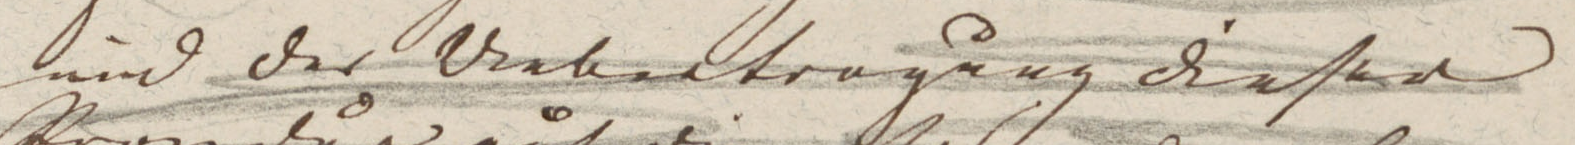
und der Uebertragung dieser
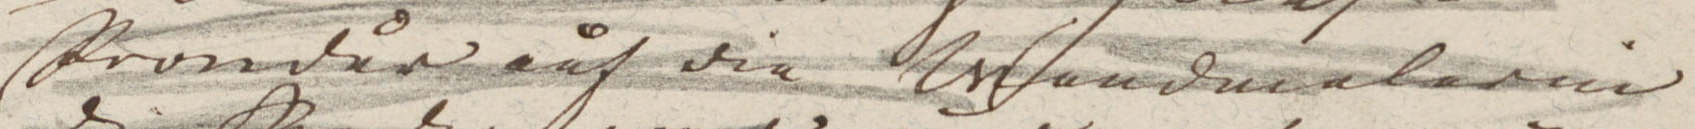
Procedur auf die Wandmalerei
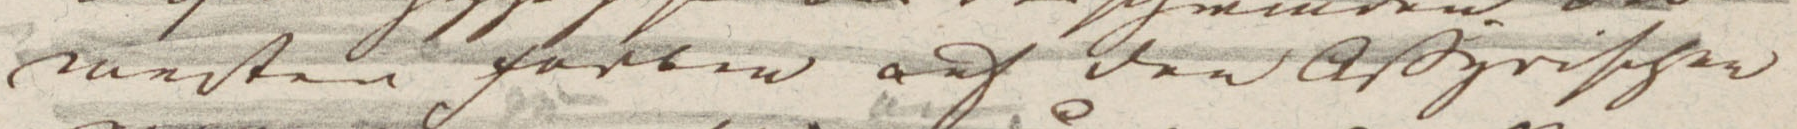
meisten Farben auf den Assyrischen
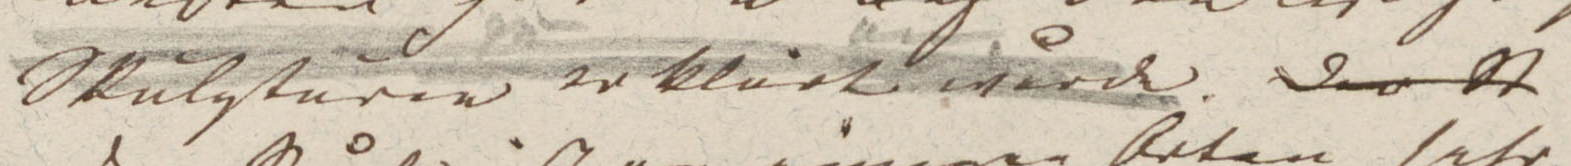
Skulpturen erklärt wurde. Der St
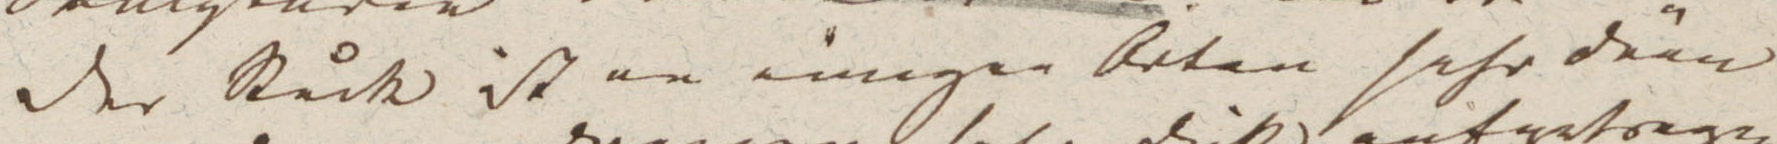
Der Stuck ist an einigen Orten sehr dünn
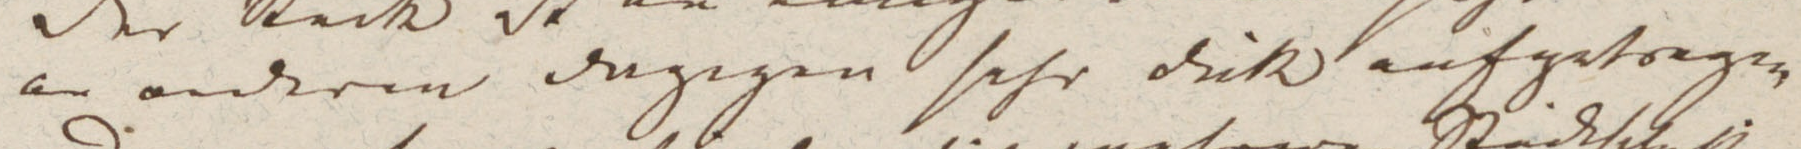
an anderen dagegen sehr dick aufgetragen
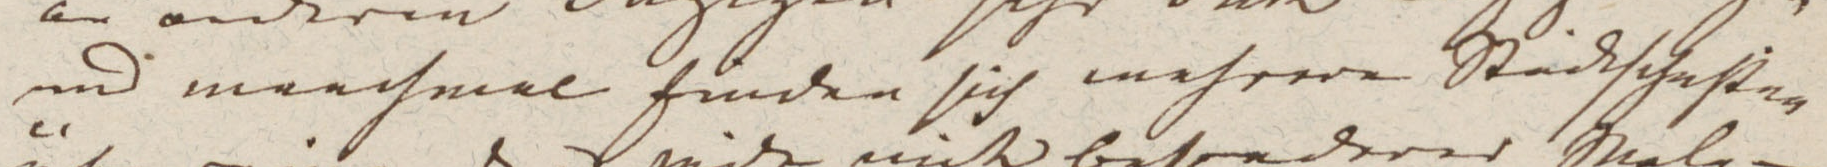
und manchmal finden sich mehrere Stuckschichten
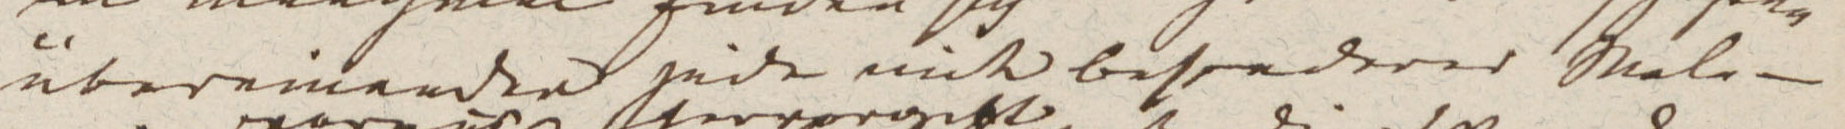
übereinander jede nicht besonderer Male-
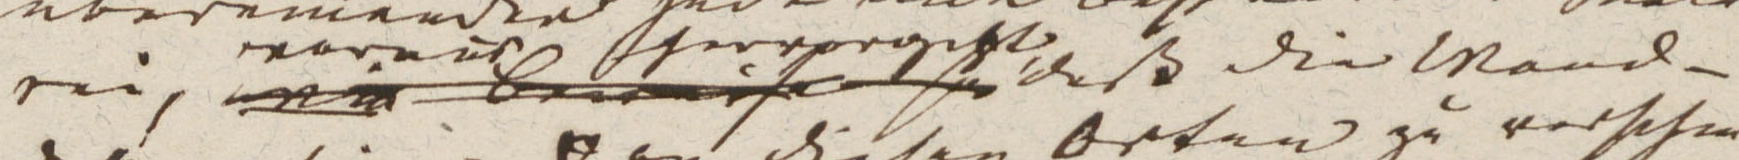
rei, wie Beweise so woraus hervorgeht, dass die Wand-
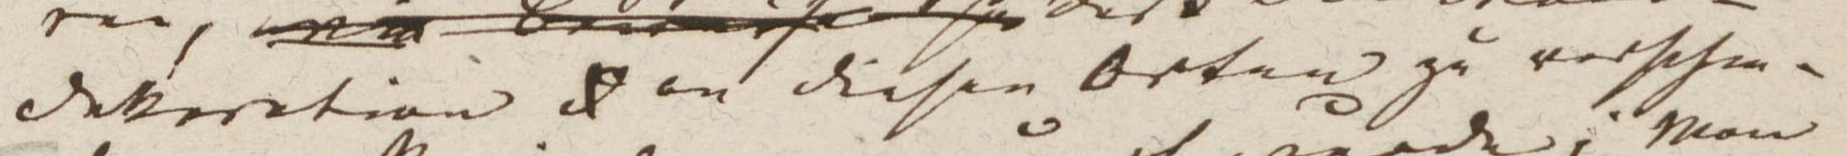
dekoration d an diesen Orten zu verschie-
